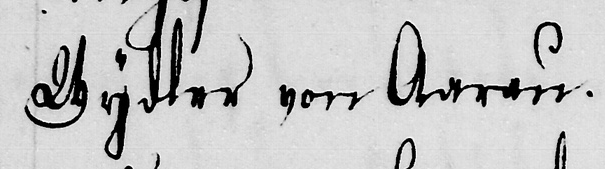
Wydler von Aarau.
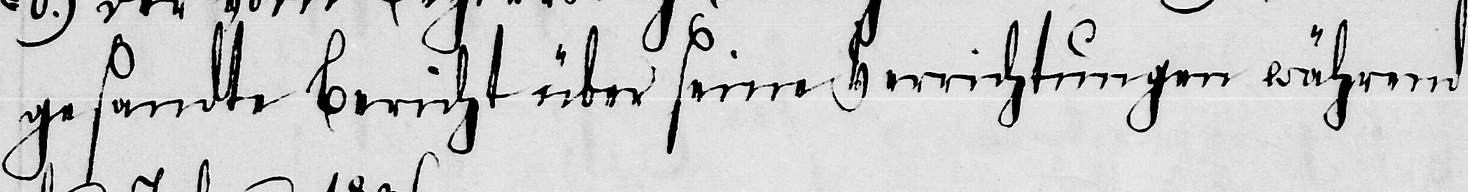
gesandte Bericht über seine Verrichtungen während
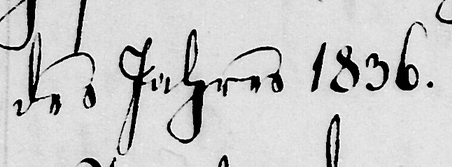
des Jahres 1836.
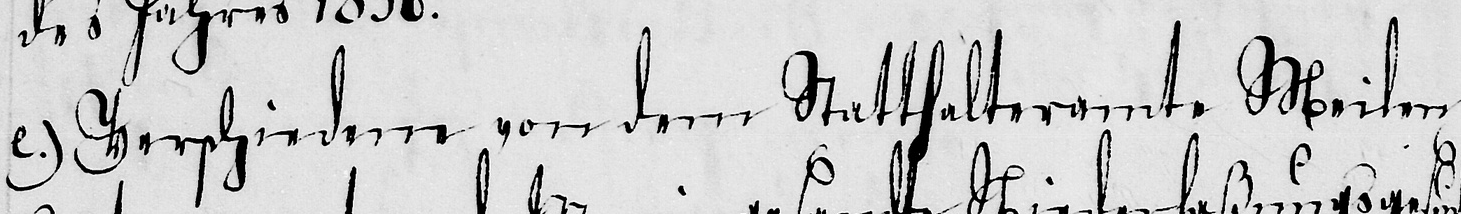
e.) Verschiedene von dem Statthalteramte Meilen
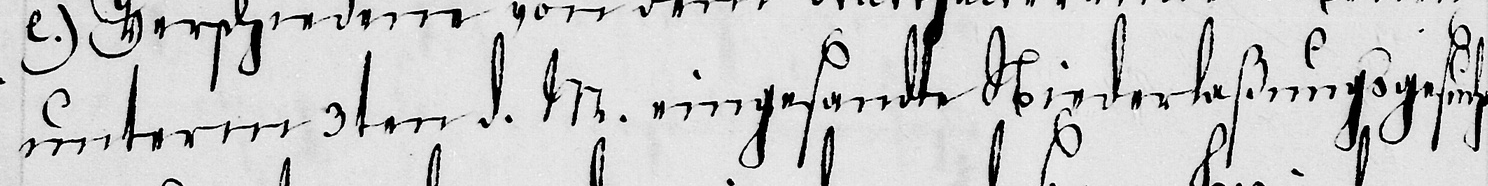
unterm 3ten d. M. eingesandte Niederlaßungsgesuc¬
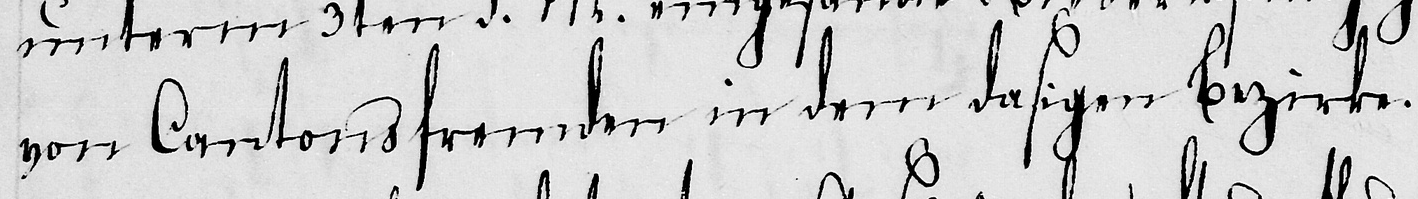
von Cantonsfremden in dem dasigen Bezirke.
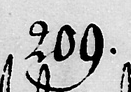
29.
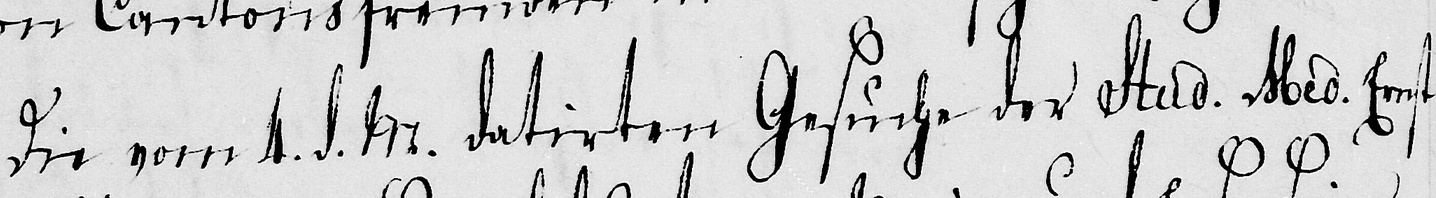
Die vom 4. d. M. datirten Gesuche der Stud. Med. Ern¬
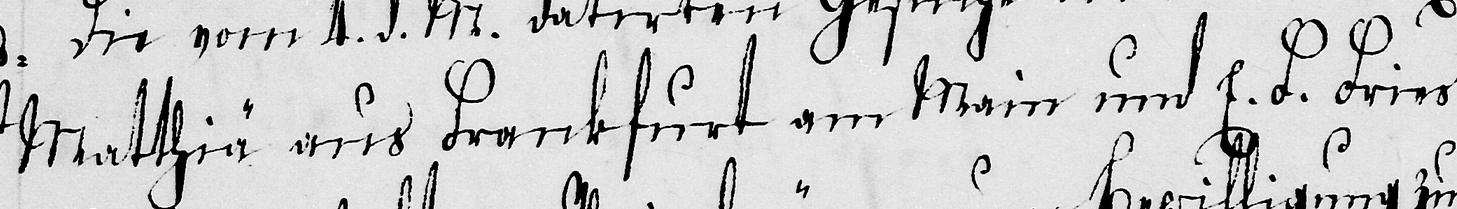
Matthiä aus Frankfurt am Main und E. F. Fries
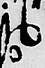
s¬
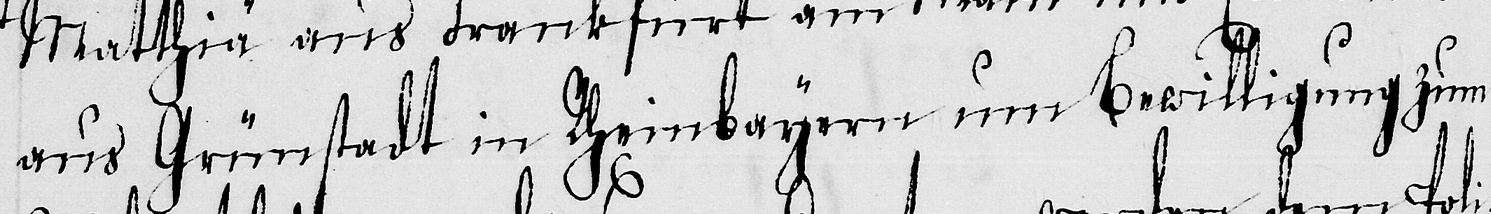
aus Grünstadt in Rheinbayern um Bewilligung zum
